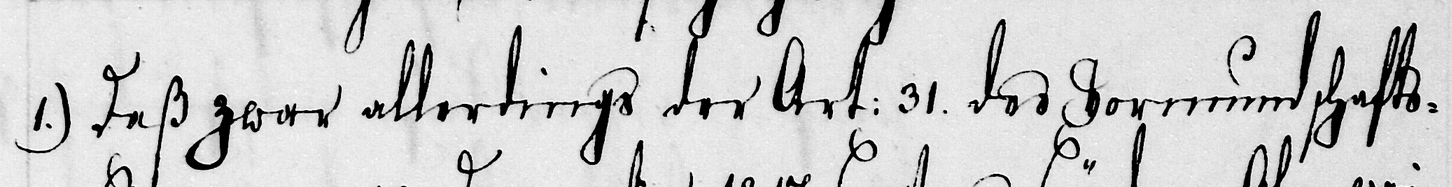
1.) Daß zwar allerdings der Art: 31. des Vormundschaft¬
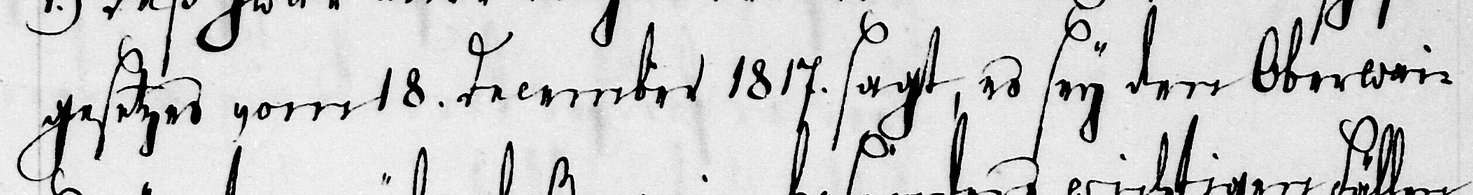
sgesetzes vom 18. December 1817. sagt, es sey den Oberwai¬
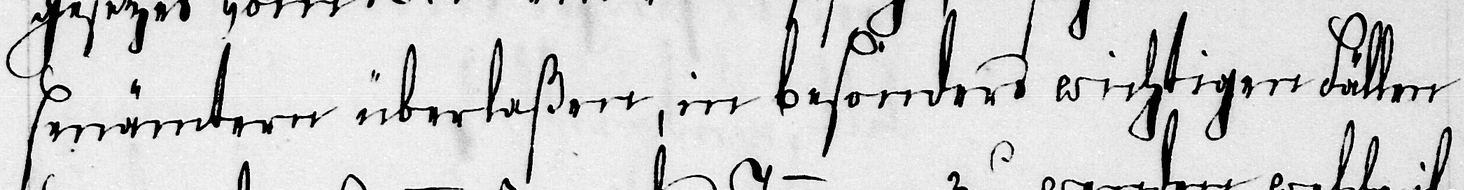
senämtern überlaßen, in besonders wichtigen Fällen
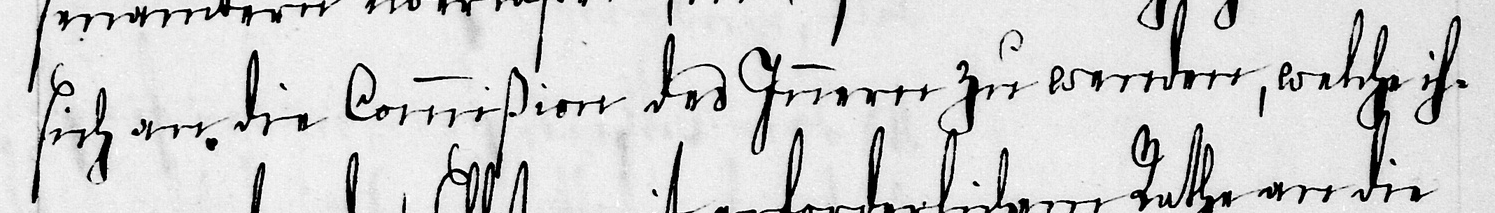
sich an die Commißion des Innern zu wenden, welche ih¬
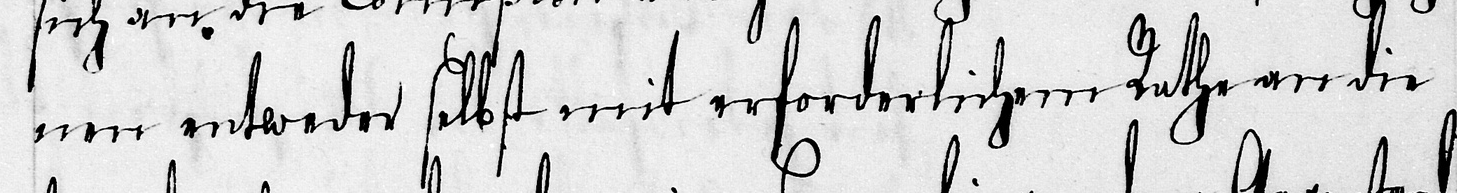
nen entweder selbst mit erforderlichem Rathe an die
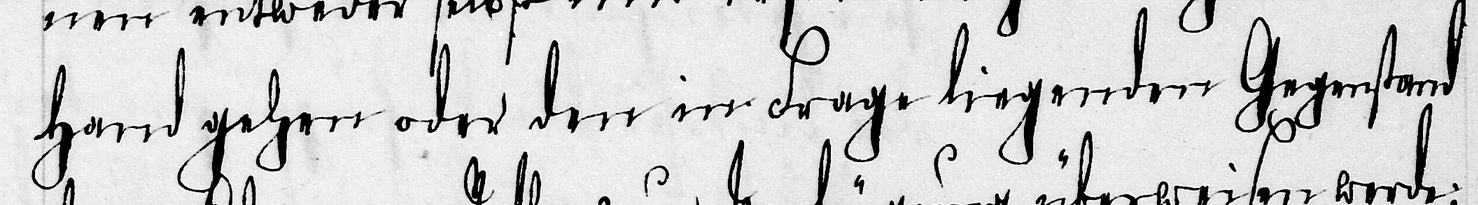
Hand gehen oder den in Frage liegenden Gegenstand
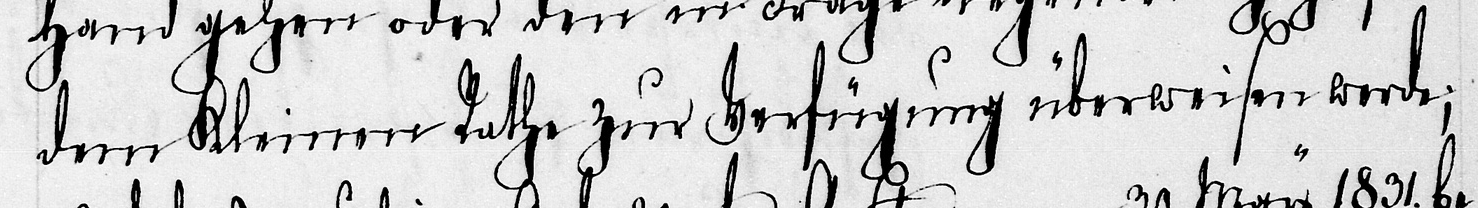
dem Kleinen Rathe zur Verfügung überweisen werde;
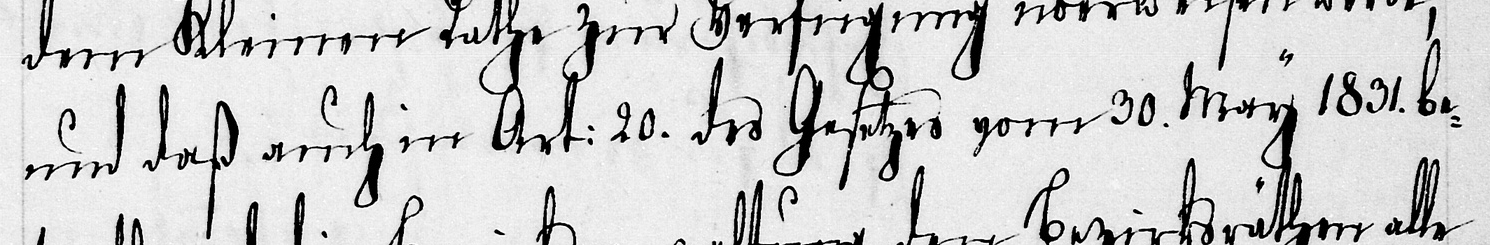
und daß auch in Art: 20. des Gesetzes vom 30. May 1831. be¬
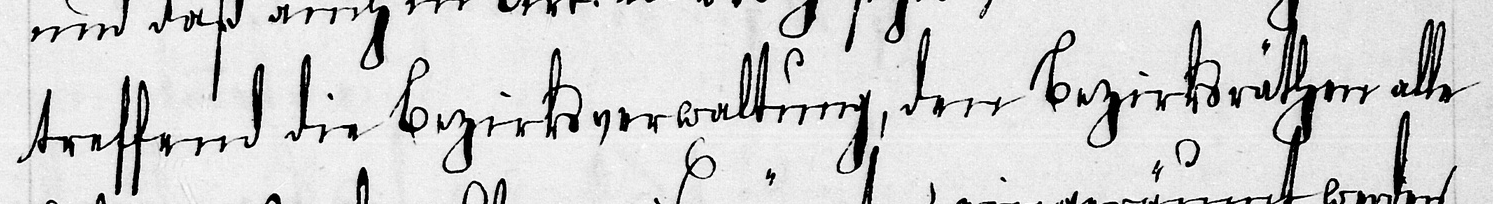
treffend die Bezirksverwaltung, den Bezirksräthen alle
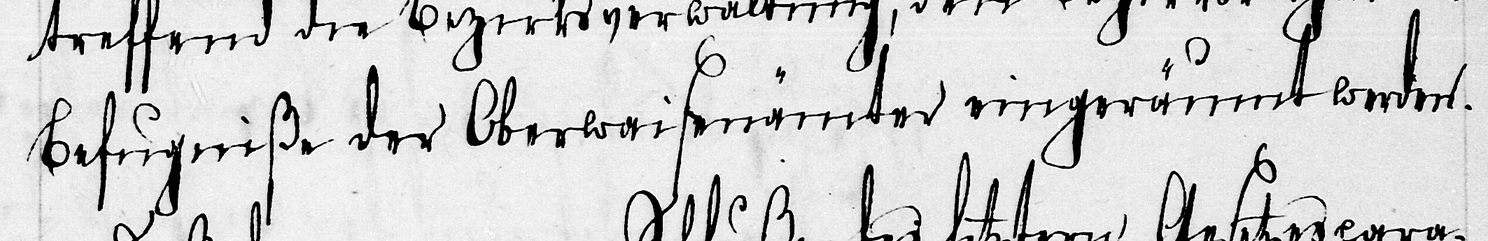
Befugniße der Oberwaisenämter eingeräumt werden.
